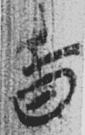昏（聞）
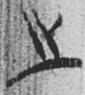之
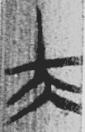夫
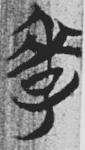季
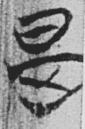是（氏）
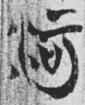河
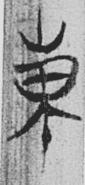東
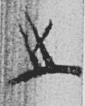之
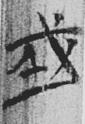城（盛）
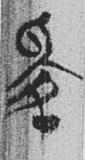○（家）
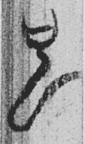也
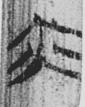亦
